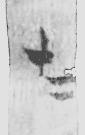十二
